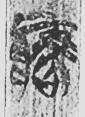{疒虎口}
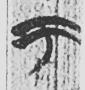于
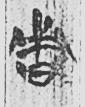周
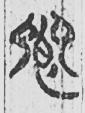卿
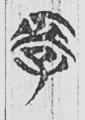李
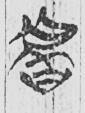者
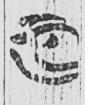正
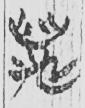萬
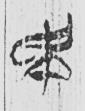民
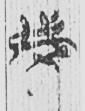弗
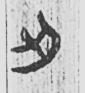刃
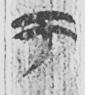于
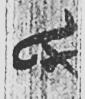氒
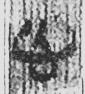心
